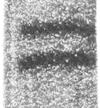二
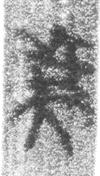○（脯）
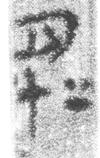四十
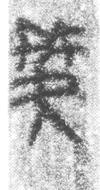○（簠）
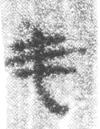屯
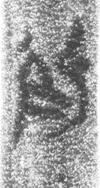紫
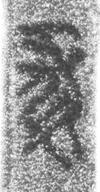緅
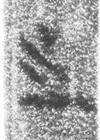之
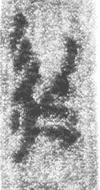紫
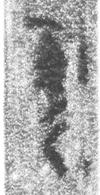緅
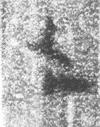之
